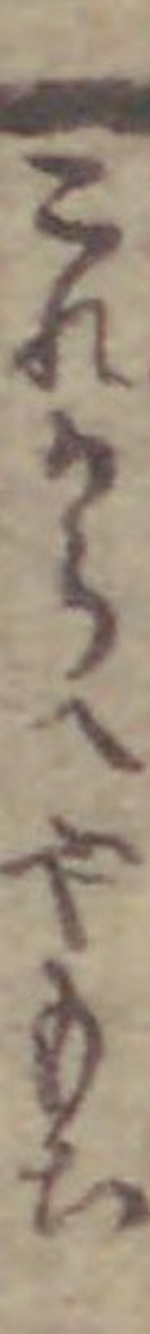これからへやもち
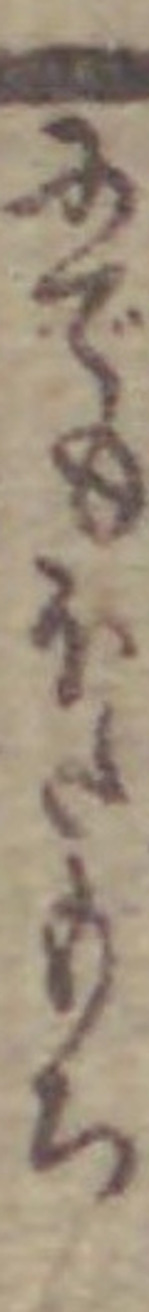にでもほたもち
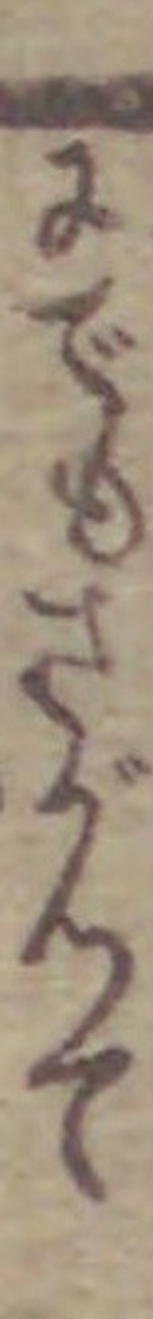にでもさがつて
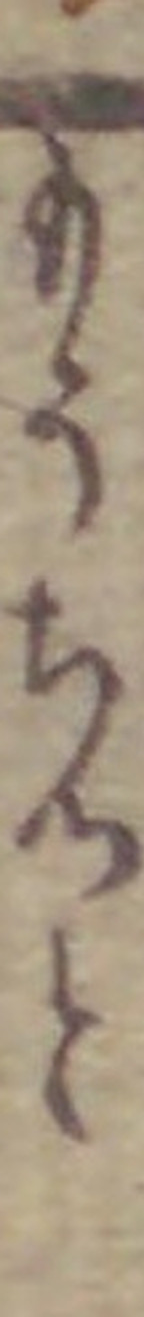もうちつと
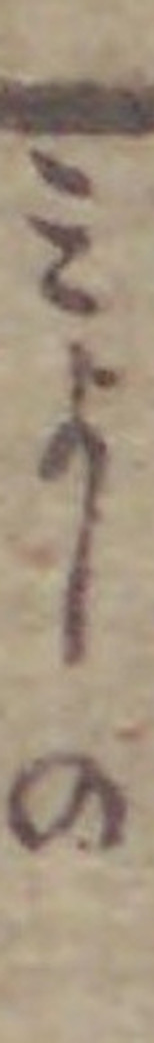みよしの
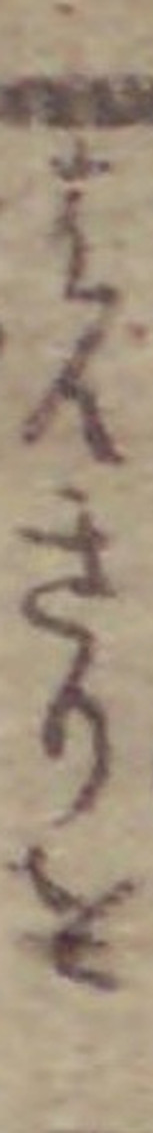はんきりを
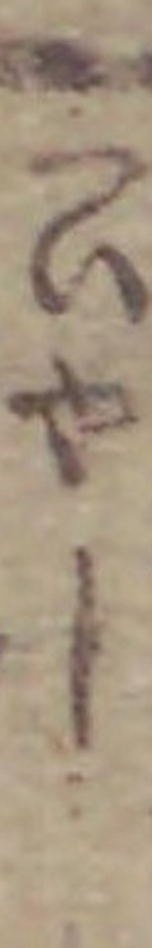ついやし
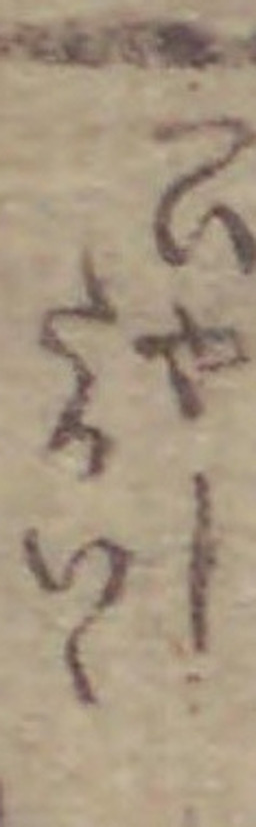たかいゝ

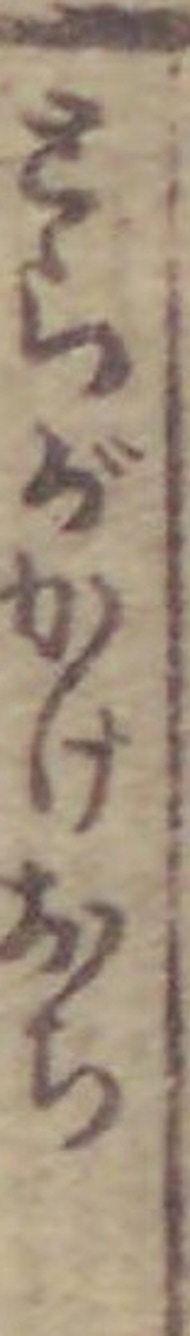とらがかけおち
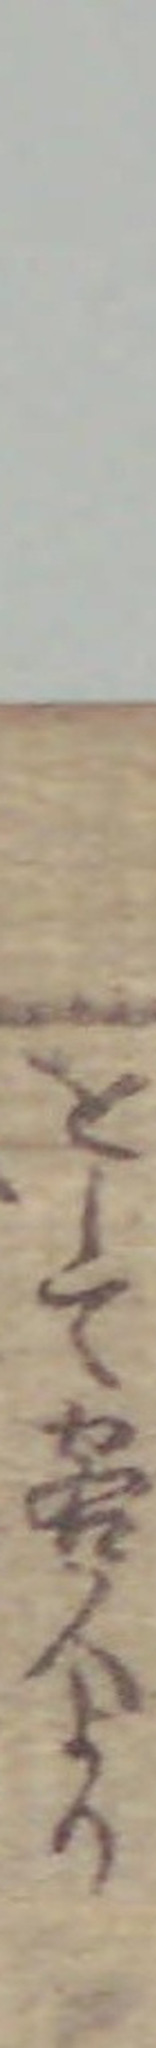をして客人より
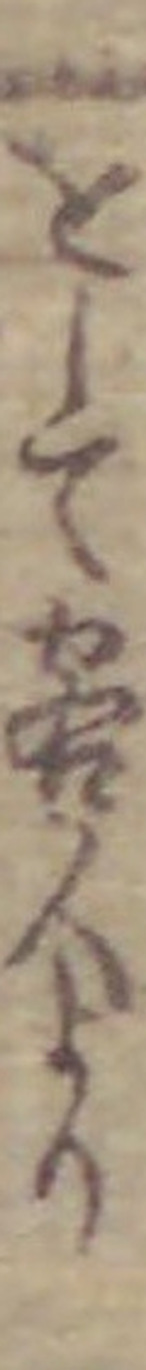をして客人より
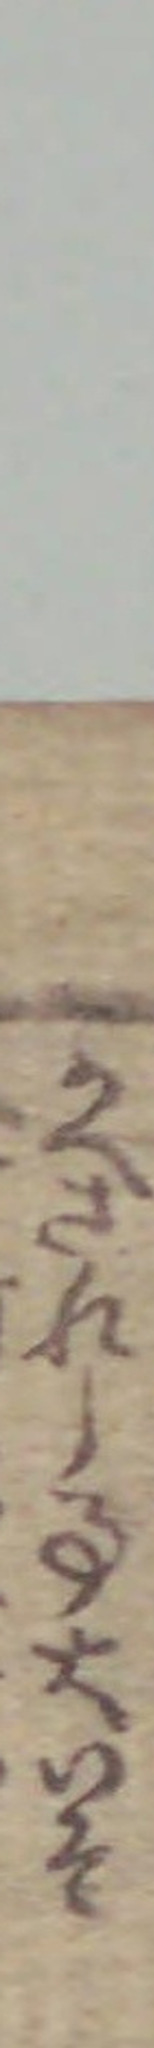かへされし事大いそ
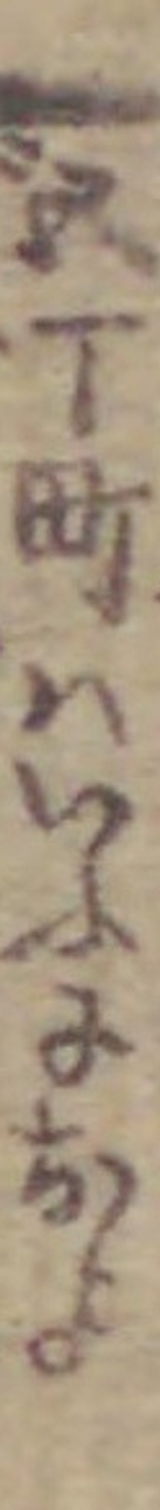五丁町はいふにおよ
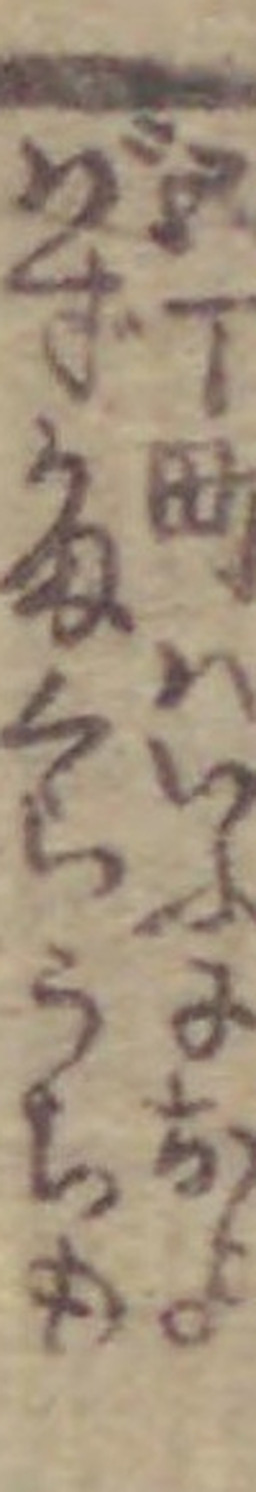ばずかまくらうちも
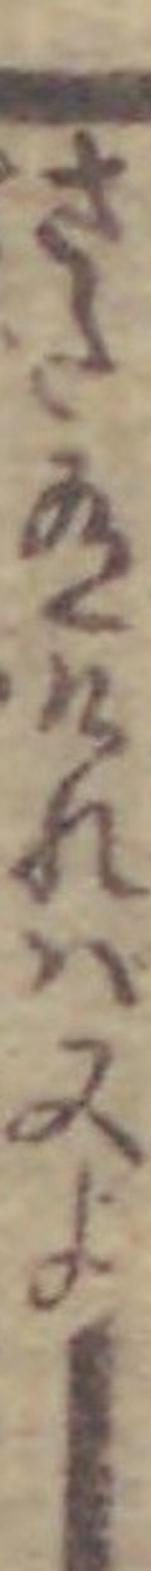さた有ければ又よ
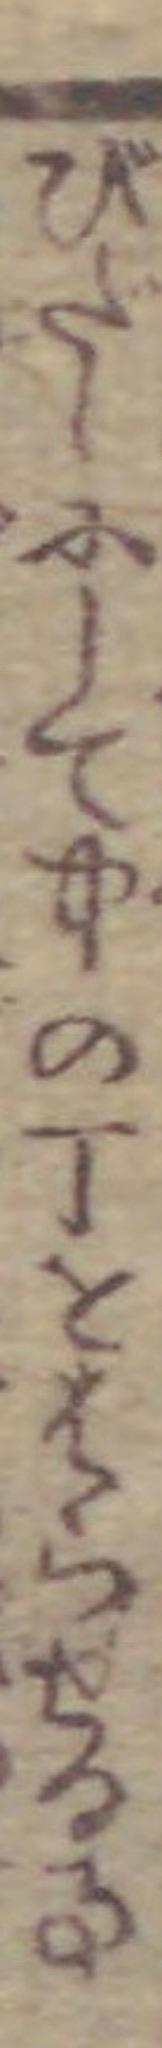びだしにして中の丁をはらせる事
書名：間似合嘘言曽我 3巻
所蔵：国立国会図書館 National Diet Library, JAPAN
